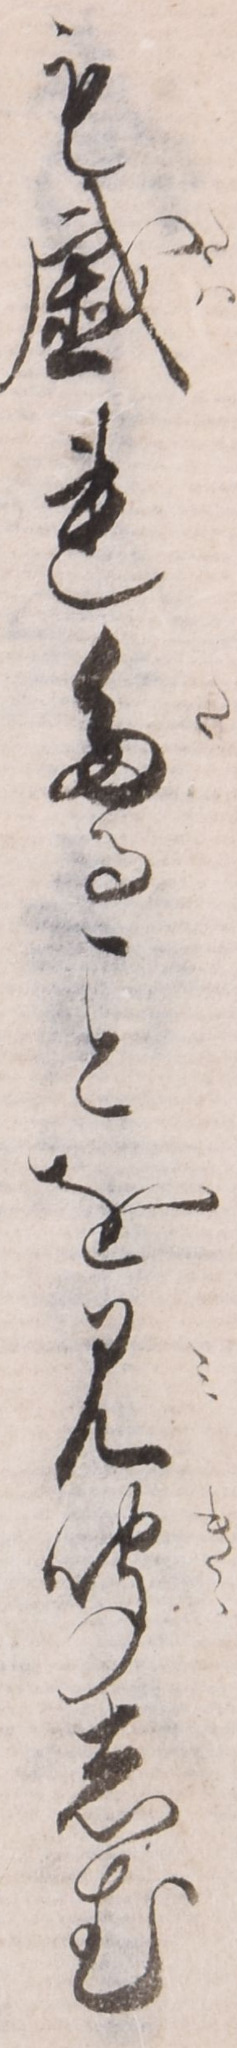も戯れ多ることを見聞しむ
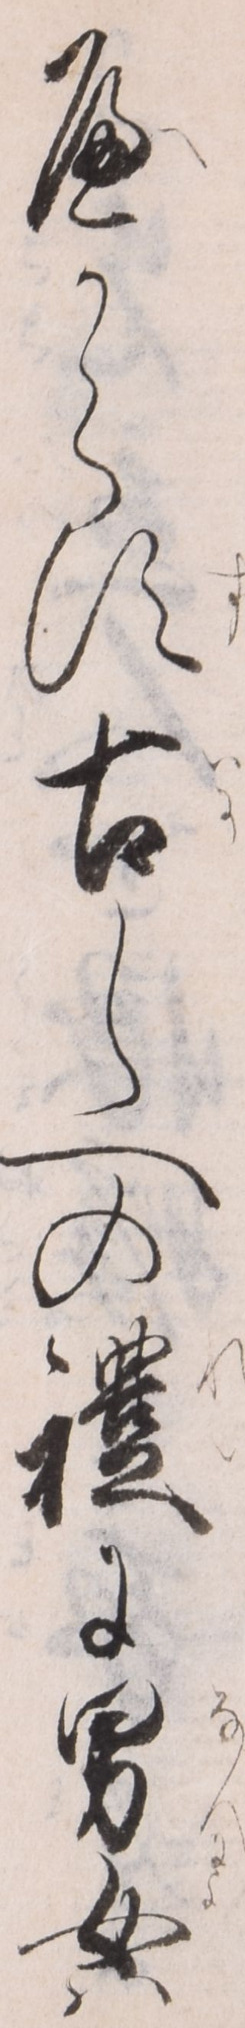遍から須古しへの礼に男女は
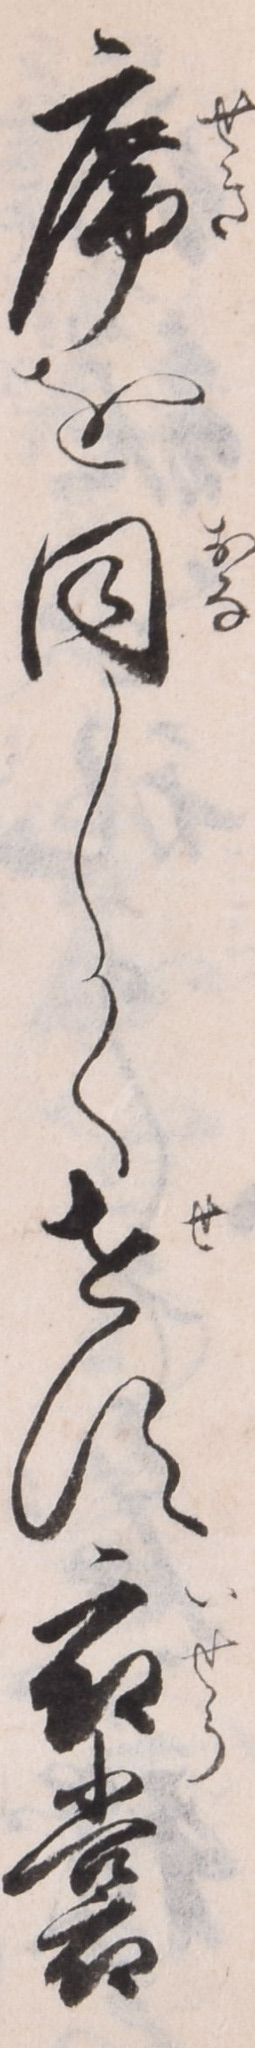席を同しく世す衣裳
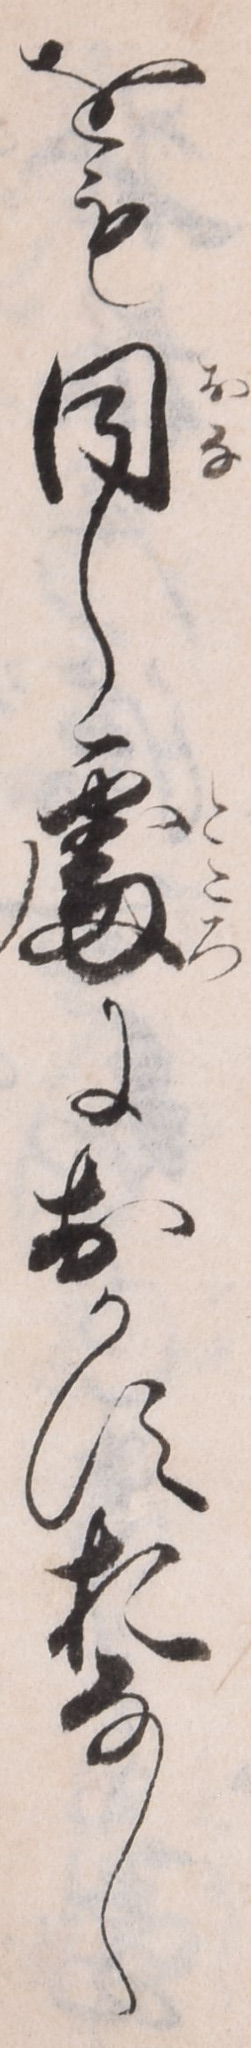をも同し処におかすおなし
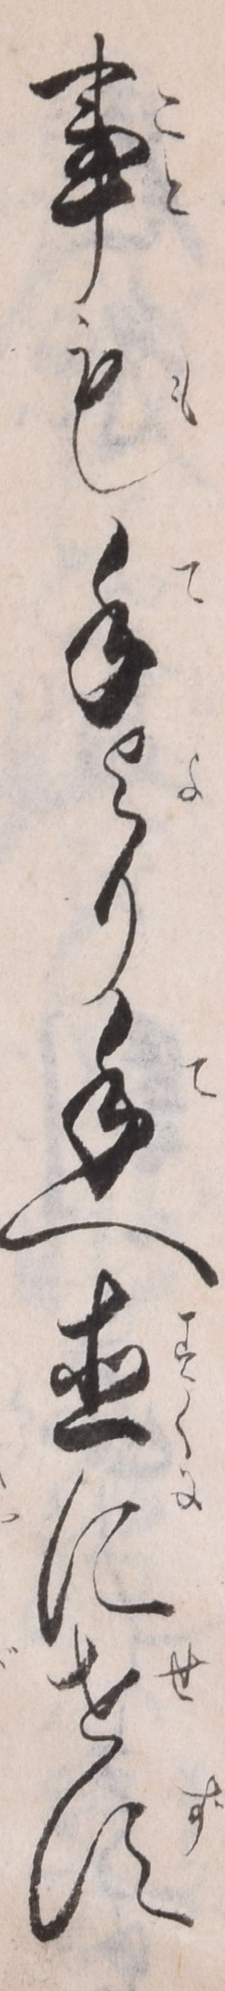事毛手与り手へ直に世須
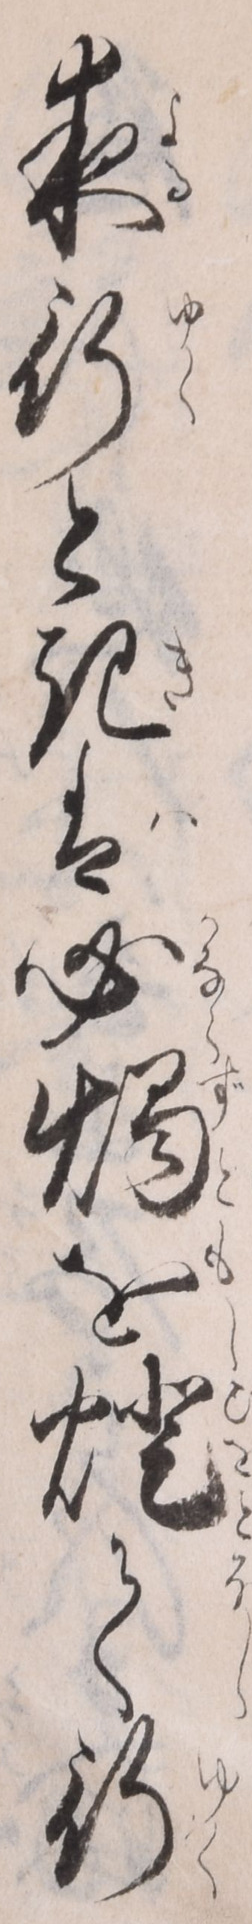夜行と起盤必燭を灯て行
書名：女子
